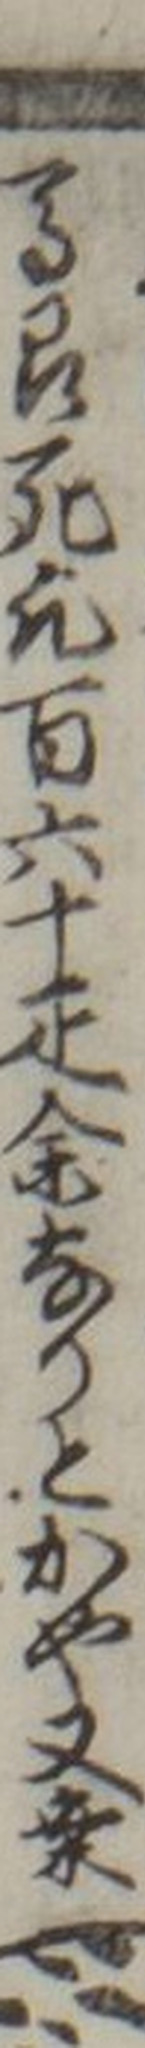馬即死凡百六十疋余なりとかや又桑
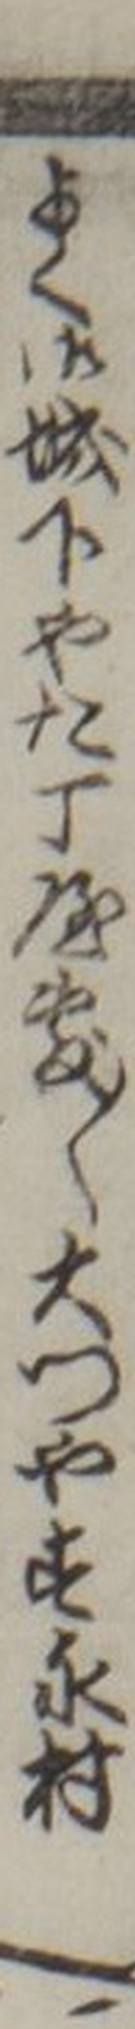よく御城下やた町屋敷〳〵大門やす永村
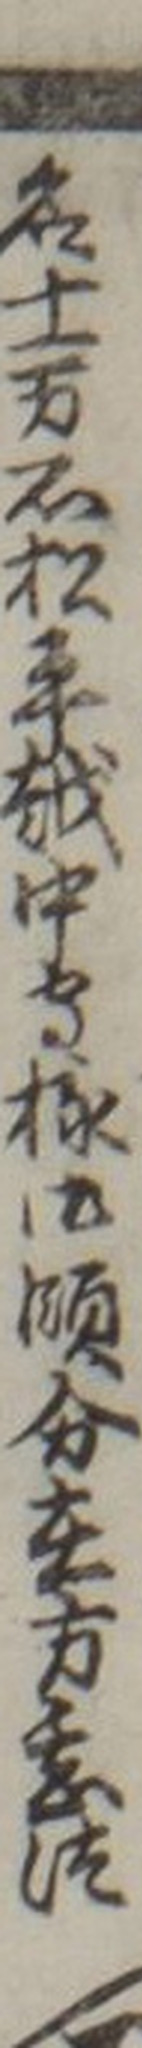名十一万石松平越中守様御領分在方甚つ
